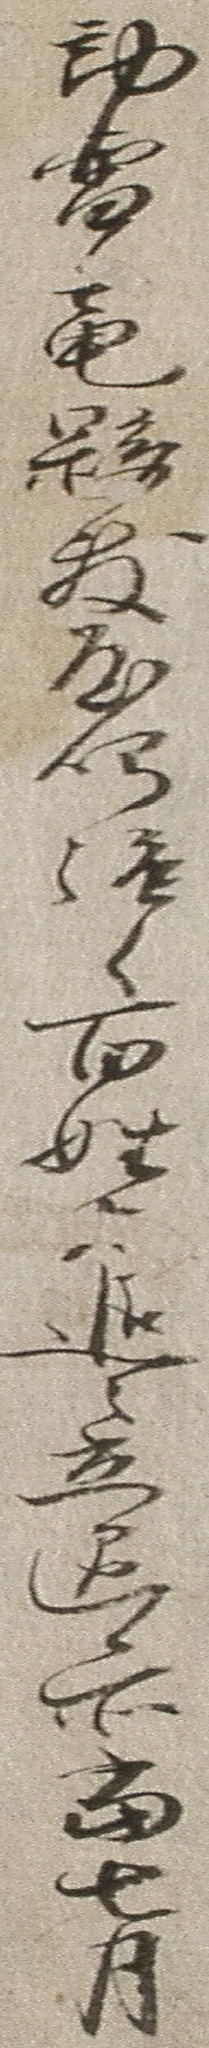動雷電夥敷屋鳴強く百姓共追々立退候所当七月
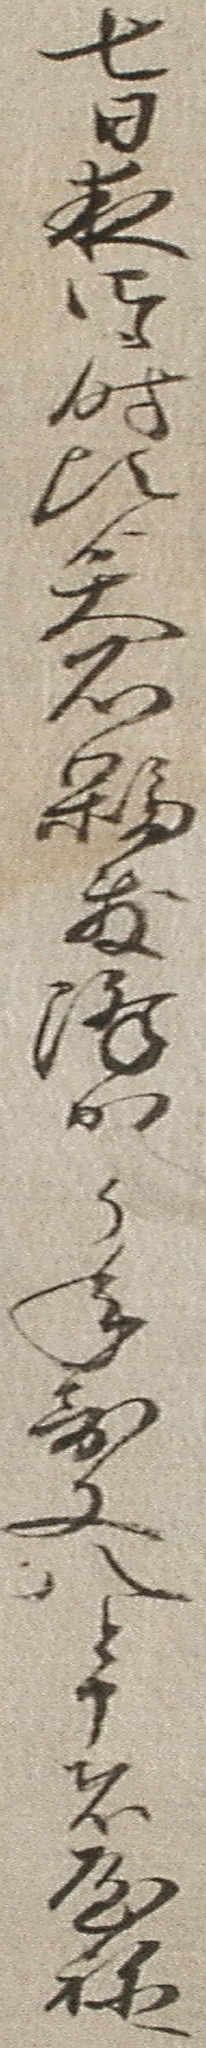七日夜四ッ時頃ゟ大石夥敷降かゝり年寄又八と申者屋ねへ
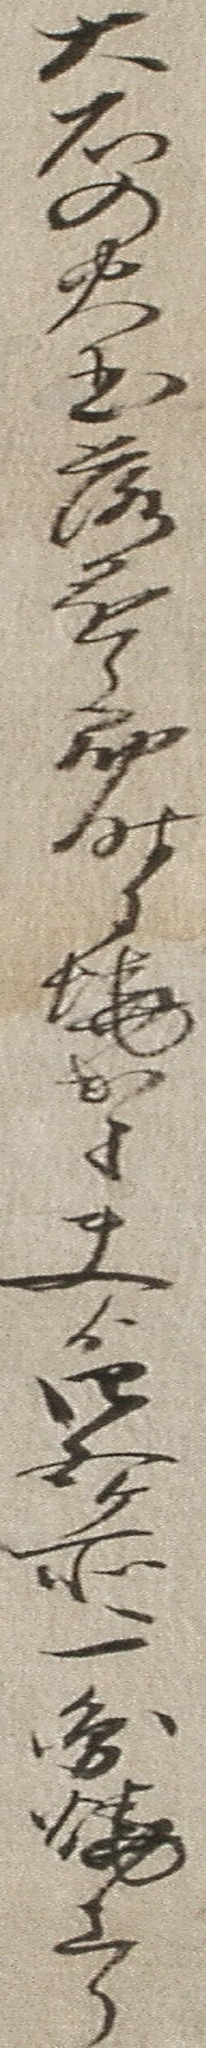大石の火玉落懸り即時に焼出す夫ゟ四五ヶ所へ一円焼上り
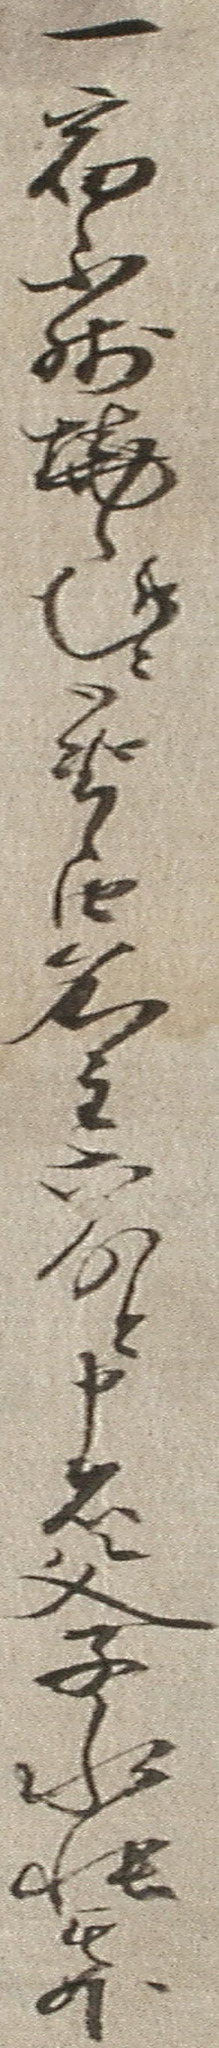一宿不残焼候趣に御座候由名主六右衛門と申者父子水帳其外
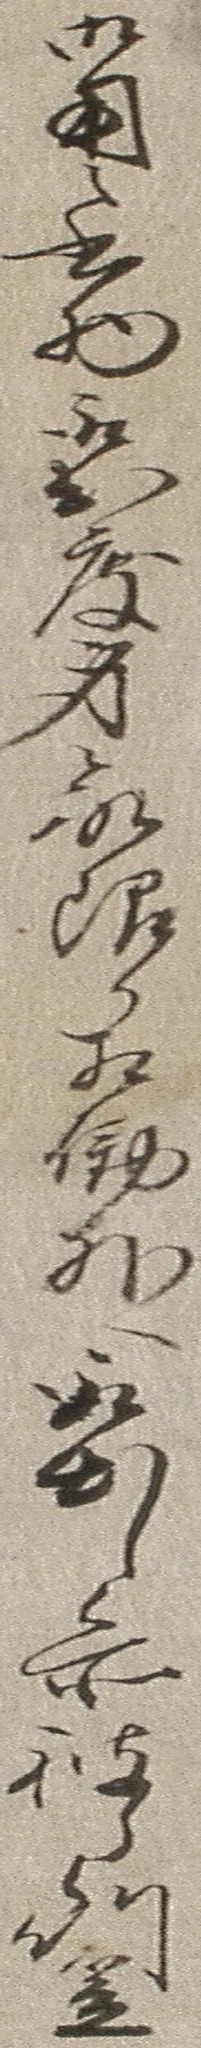御用之書物取出度身に有限り相働外へ取出し候所被り候則笠
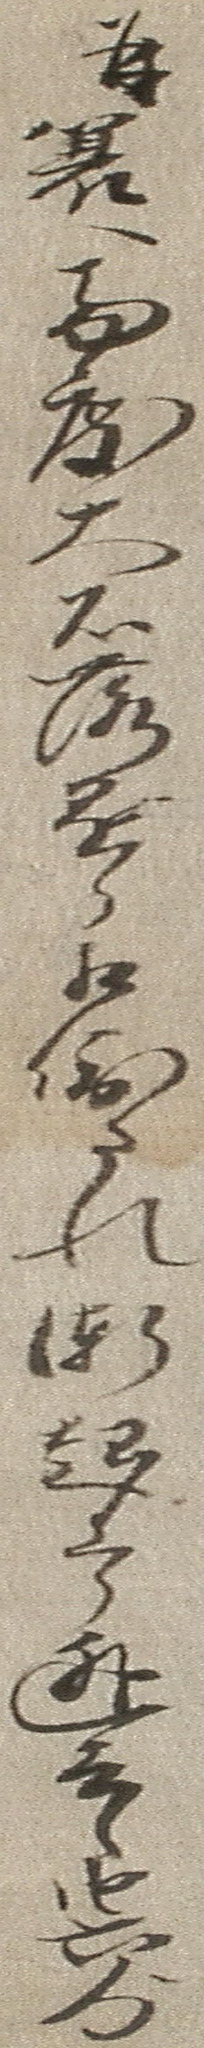并箕へ兩度大石落懸り相倒たれ漸起上り逃去候由六右衛門
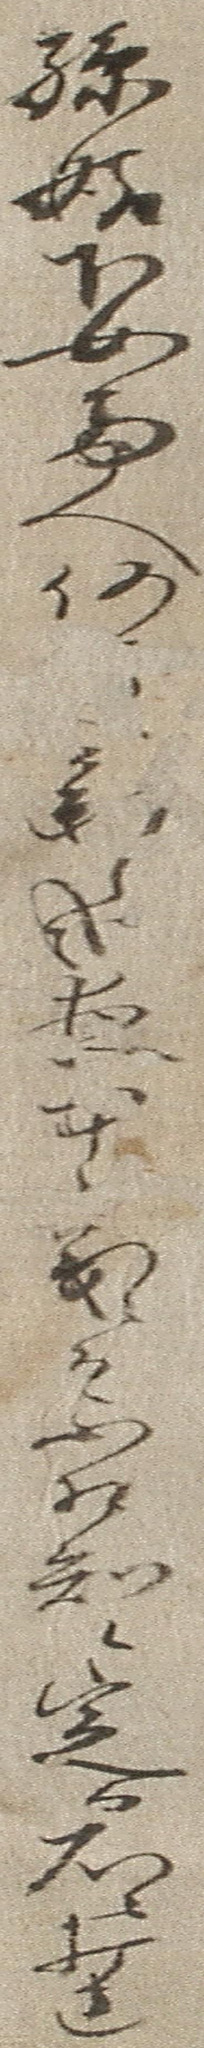孫娘下女両人何方へ参候哉夜中之義ニ而不相知候定而石に打れ
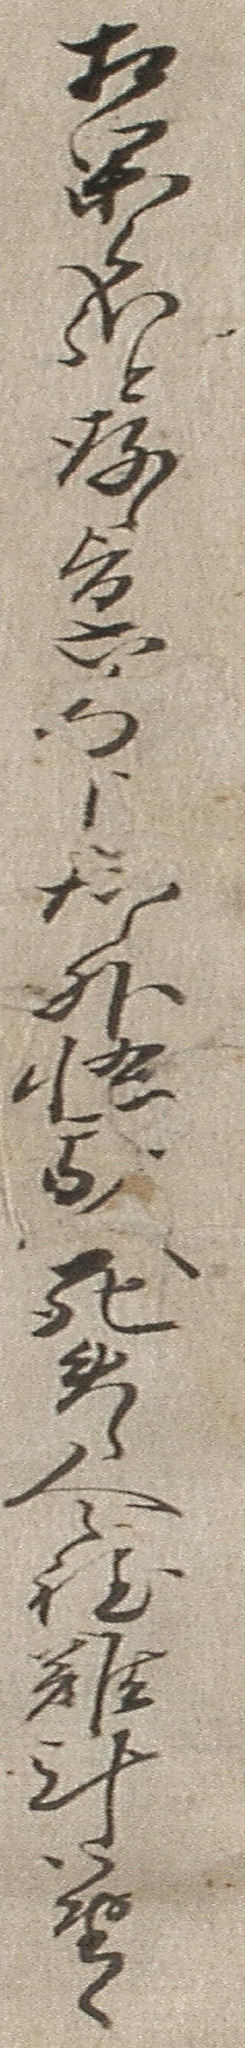相果候哉と存候旨六右衛門申候右之外忰人死失候人之程難計御座候
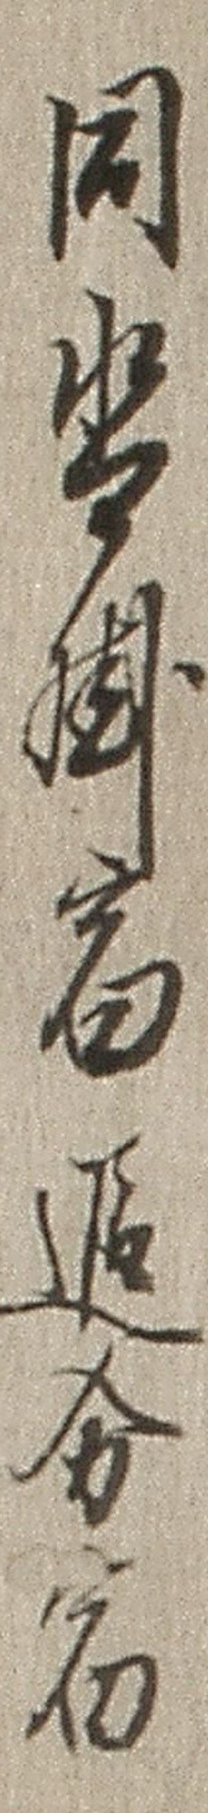同沓掛宿追分宿
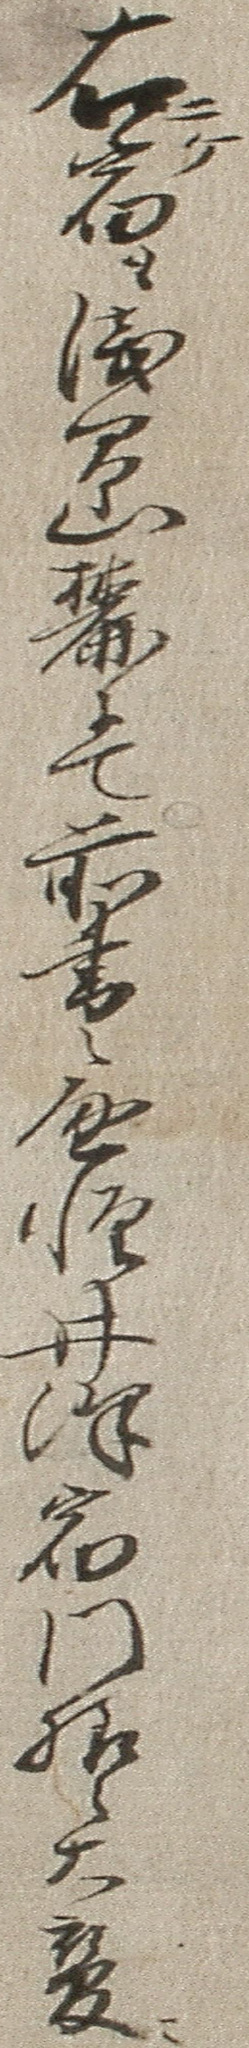右二ヶ宿も浅間山麓にて前書之通軽井沢宿同様之大変に
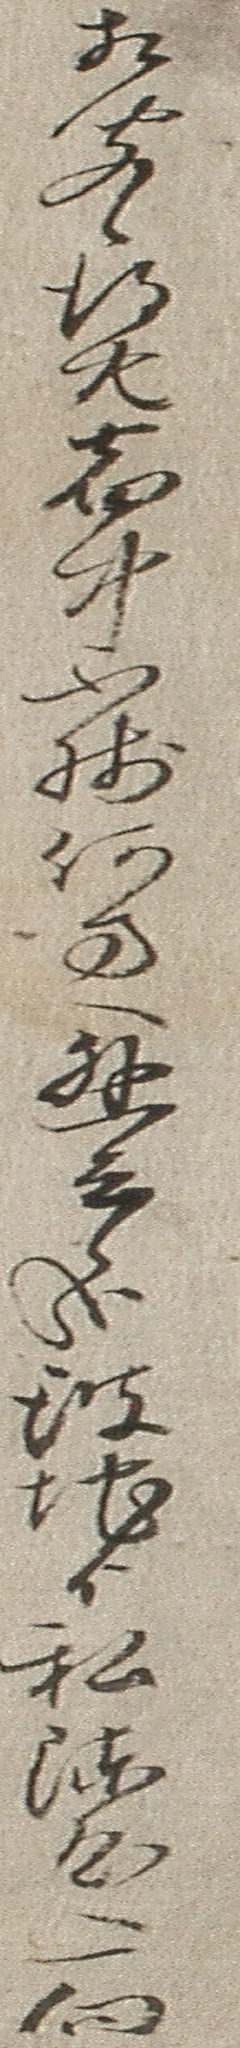相聞候得共宿中不残何方へ逃去哉彼地ゟ私陣屋へ一向
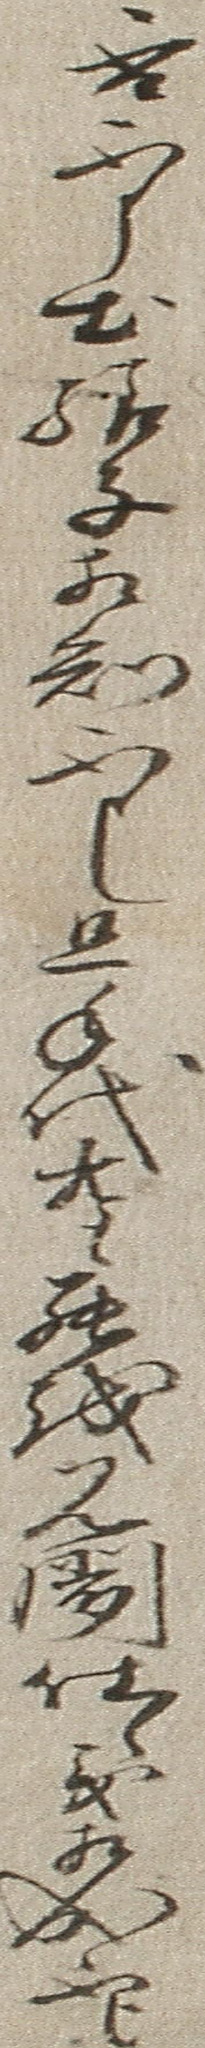書不申出様子相知不申候且手代共も罷越見聞仕候義相成不申候
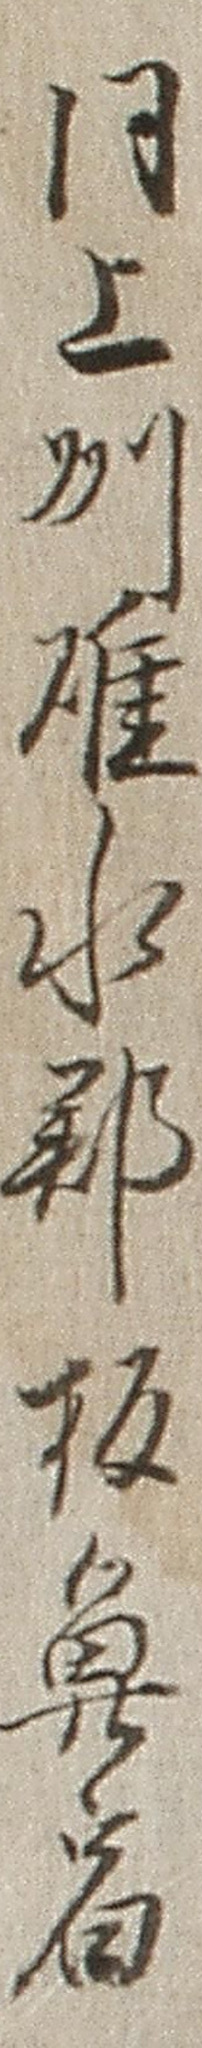同上州碓水郡板鼻宿
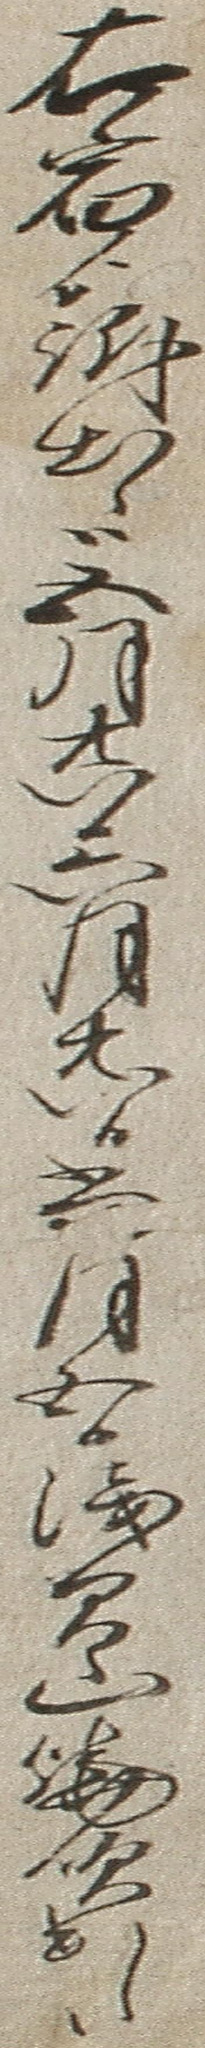右宿ゟ訴出候は五月廿八日六月廿八日当月五日浅間山焼吹出し候
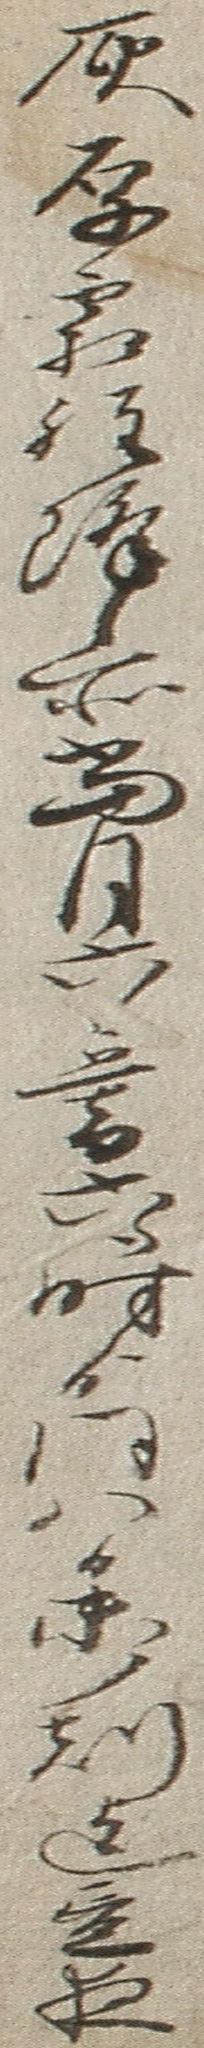灰厚霜程降候所当月六日暮六ッ時ゟ同八日未ノ刻迄昼夜
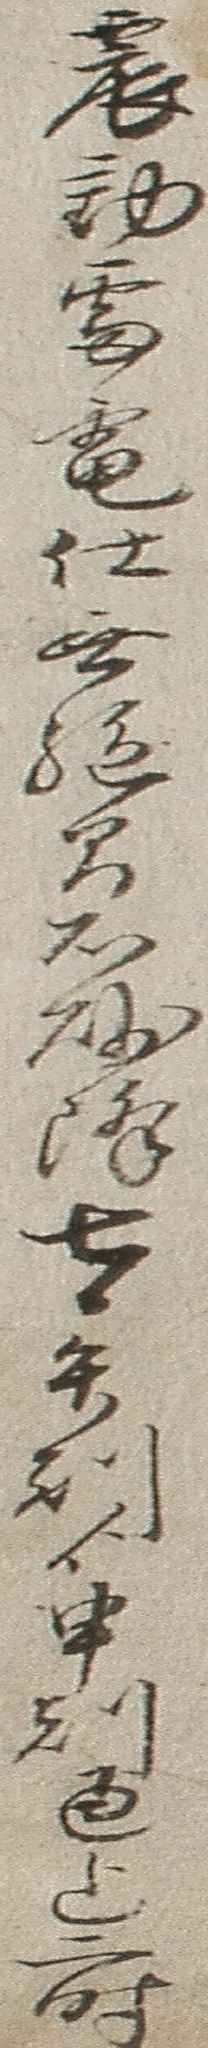震動雷電仕無絶間石砂降七日午ノ刻ゟ申刻過迄二時
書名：太平秘録抜書　浅間山燒及普賢山崩
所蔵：東京大学地震研究所図書室 Earthquake Research Institute Library, The University of Tokyo, JAPAN
